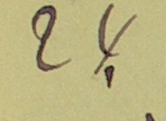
24
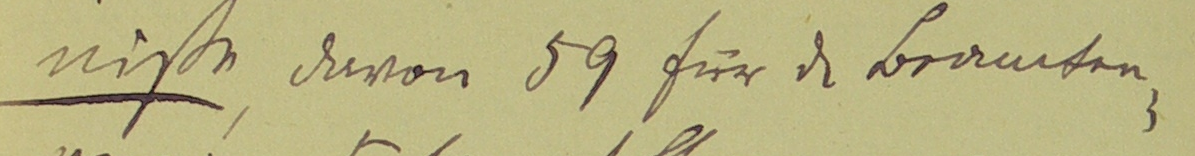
niße davon 59 für Beamten¬
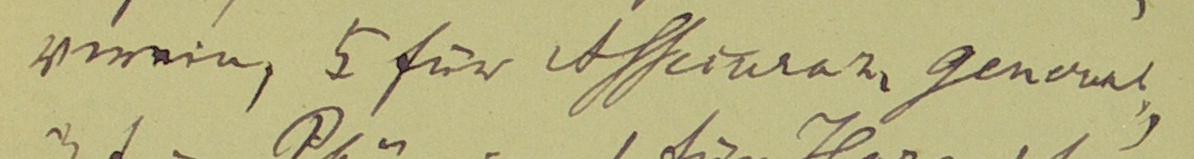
verein, 5 für Assicuracione generali,
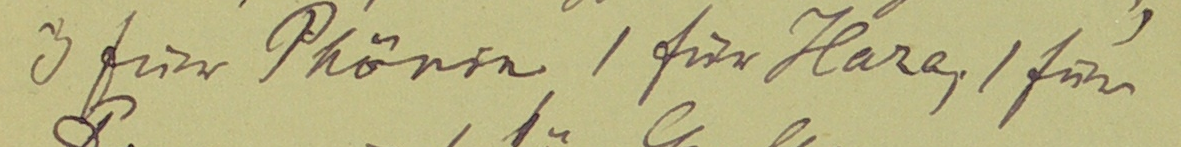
3 für Phönix 1 für Tlara, 1 für
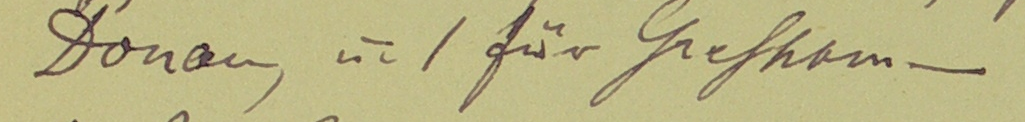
Donau und 1 für Hestony.
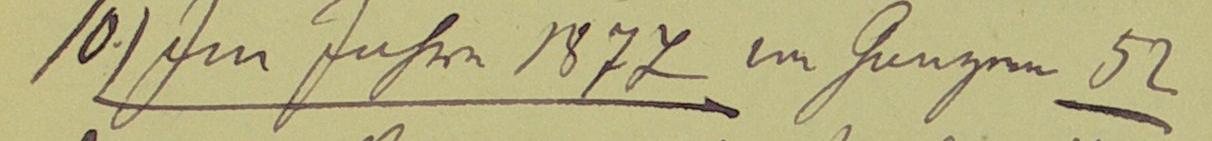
10) Im Jahre 1877 im Ganzen 52
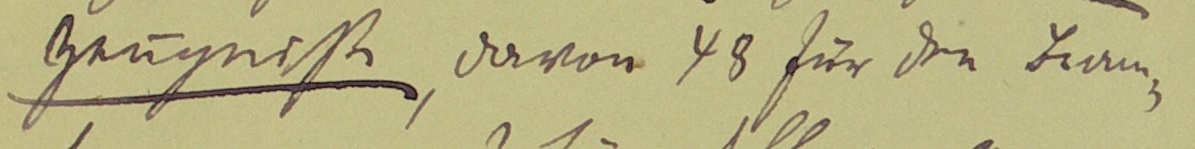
Zeugniße, davon 48 für den Beam¬
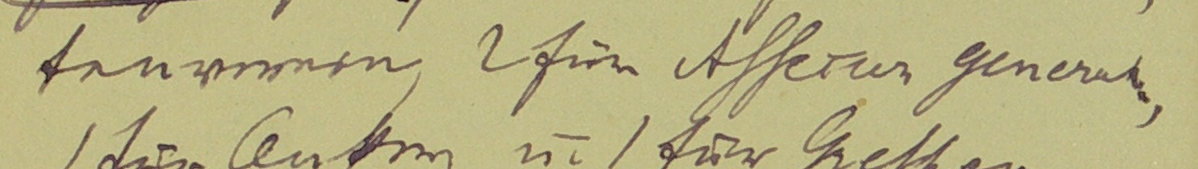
tenverein, 2 für Assicuracione generali,
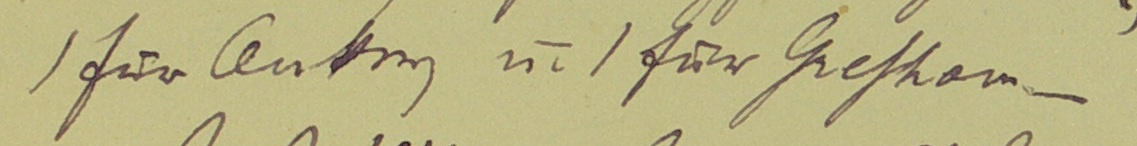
1 für Ankry und 1 für Hestony.
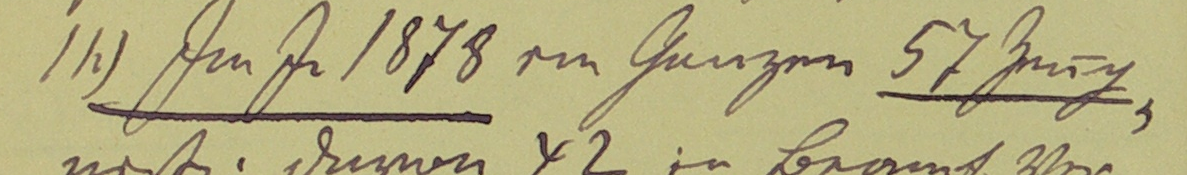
11) Im Jahre 1878 im Ganzen 57 Zeug¬
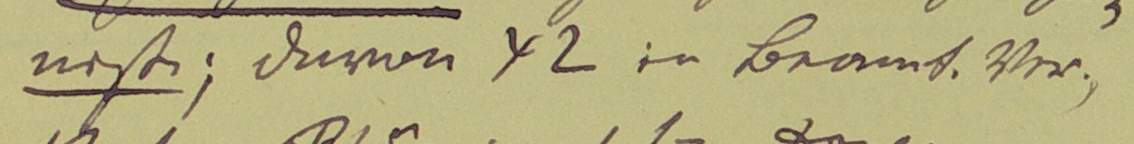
niße, davon 42 in Beamtenverein,
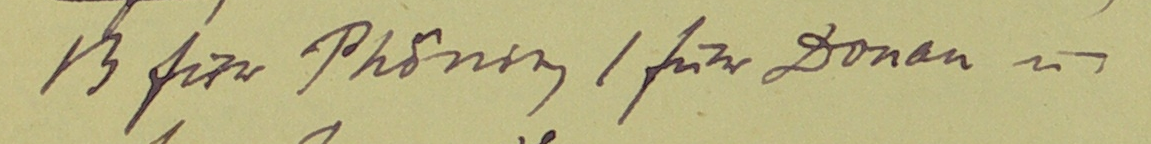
13 für Phönix, 1 für Donau,
